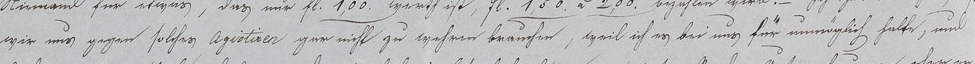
wir uns gegen solches Agiotiren gar nicht zu wehren brauchen, weil ich es bei uns für unmöglich halte, und
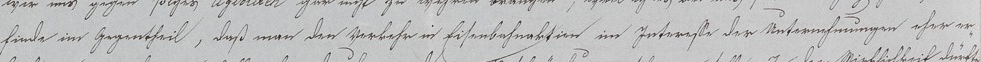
finde im Gegentheil, daß man den Verkehr in Eisenbahnaktien im Interesse der Unternehmungen eher er-
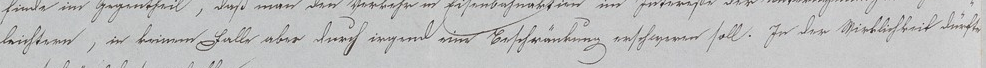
leichtern, in keinem Falle aber durch irgend eine Beschränkung erschweren soll. In der Wirklichkeit dürfte
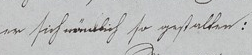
er sich nämlich so gestalten:
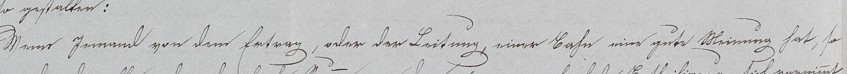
Wenn Jemand von dem Ertrag, oder der Leitung, einer Bahn eine gute Meinung hat, so
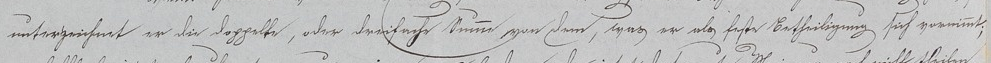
unterzeichnet er die doppelte, oder dreifache Summe von dem, was er als feste Betheiligung sich vornimmt;
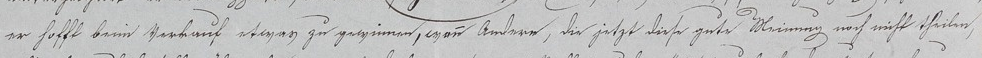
er hofft beim Verkauf etwas zu gewinnen, wenn Andere, die jetzt diese gute Meinung noch nicht theilen,
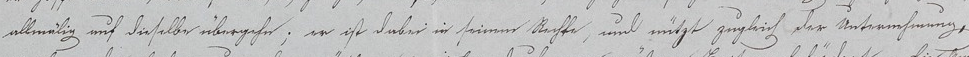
allmälig auf dieselbe übergehn; er ist dabei in seinem Rechte, und nützt zugleich der Unternehmung,
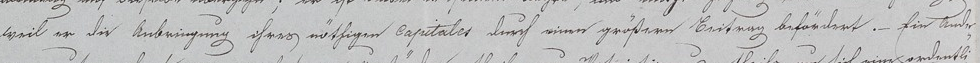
weil er die Anbringung ihres nöthigen Capitales durch einen größern Beitrag befördert. – Ein Ande-
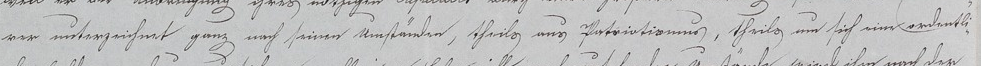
rer unterzeichnet ganz nach seinen Umständen, theils aus Patriotismus, theils um sich eine ordentli-
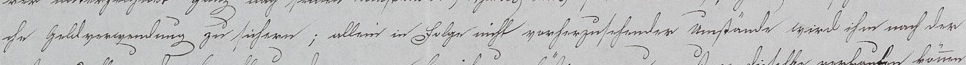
che Geldverwendung zu sichern; allein in Folge nicht vorherzusehender Umstände wird ihm nach der
